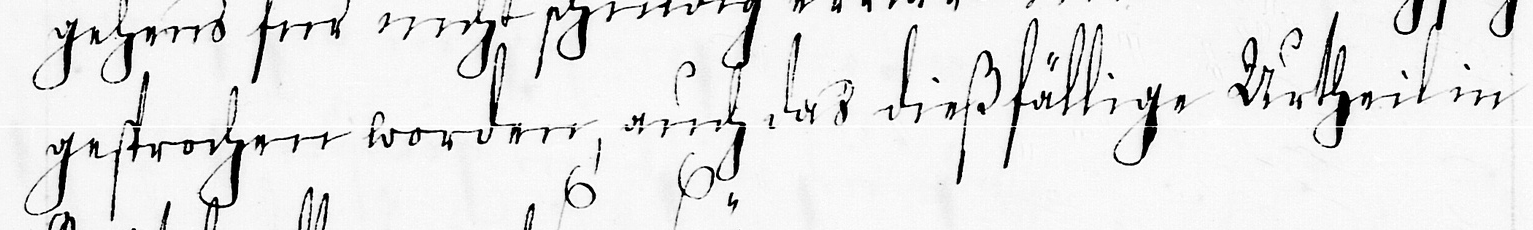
gesprochen worden, auch das dießfällige Urtheil in
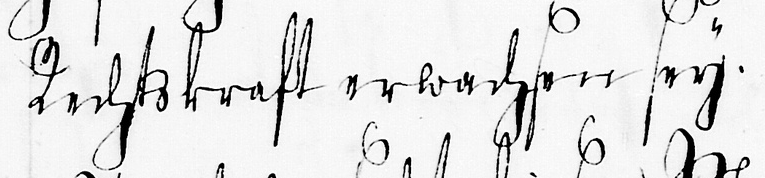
Rechtskraft erwachsen sey.
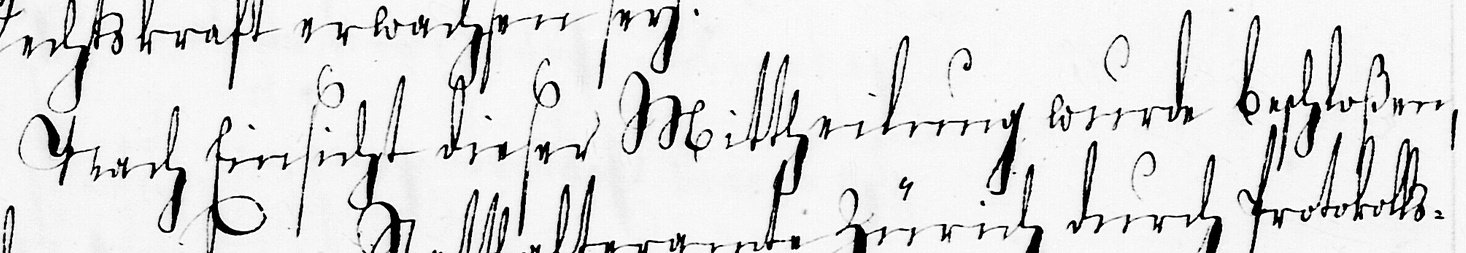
Nach Einsicht dieser Mittheilung wurde beschloßen,
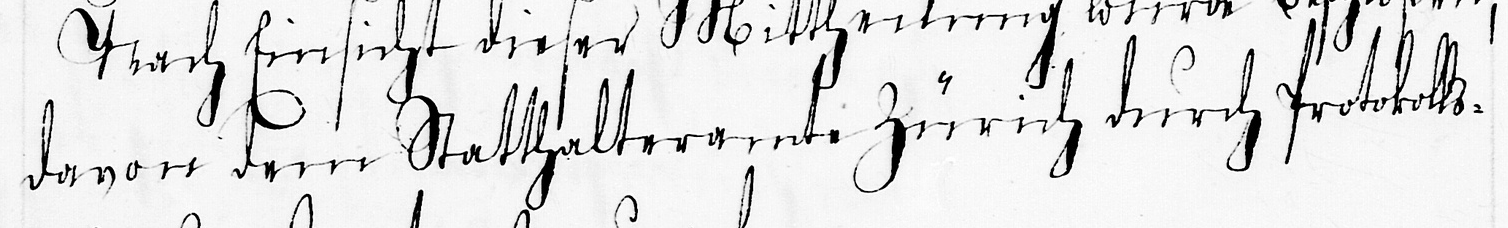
davon dem Statthalteramte Zürich durch Protokol¬
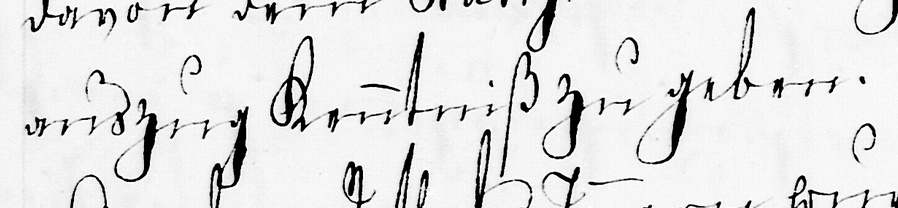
auszug Kenntniß zu geben.
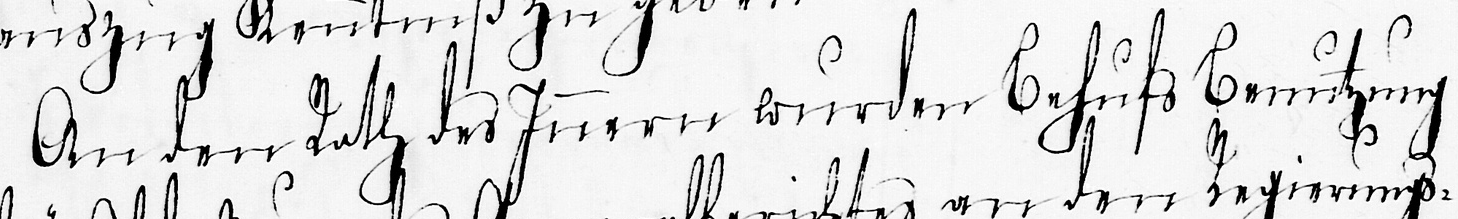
An den Rath des Innern wurden Behufs Benutzung
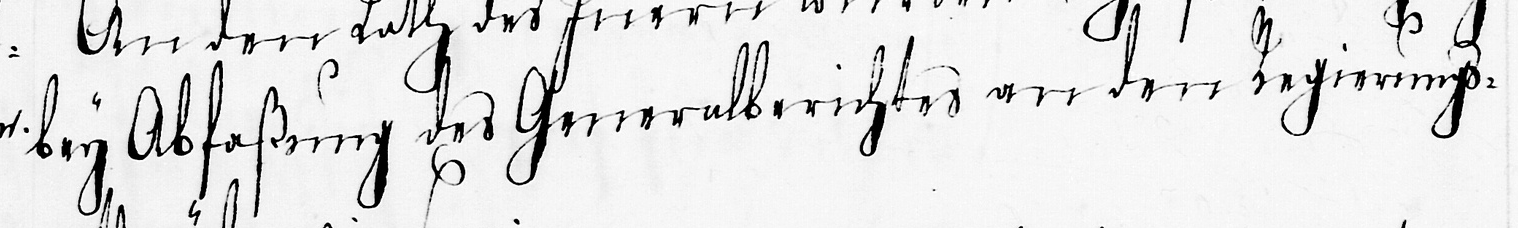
bey Abfaßung des Generalberichtes an den Regierungs¬
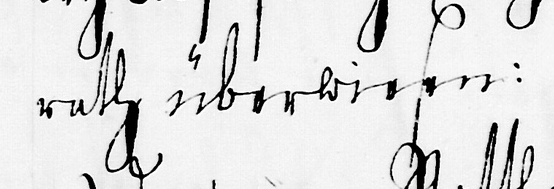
rath überwiesen:
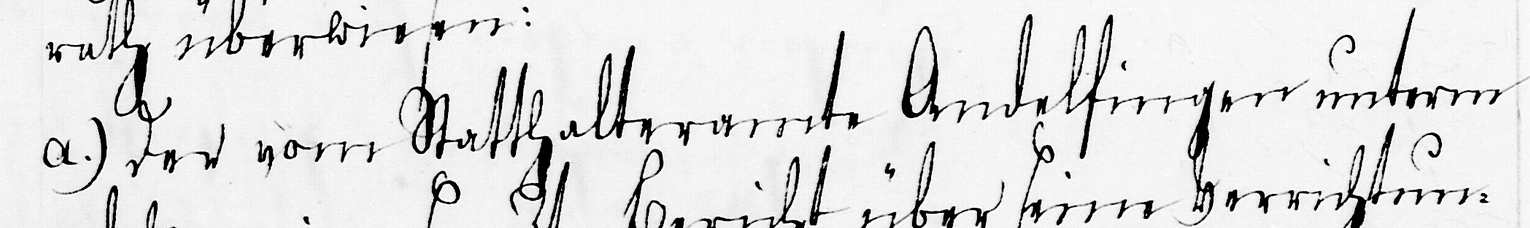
a.) Der vom Statthalteramte Andelfingen unterm
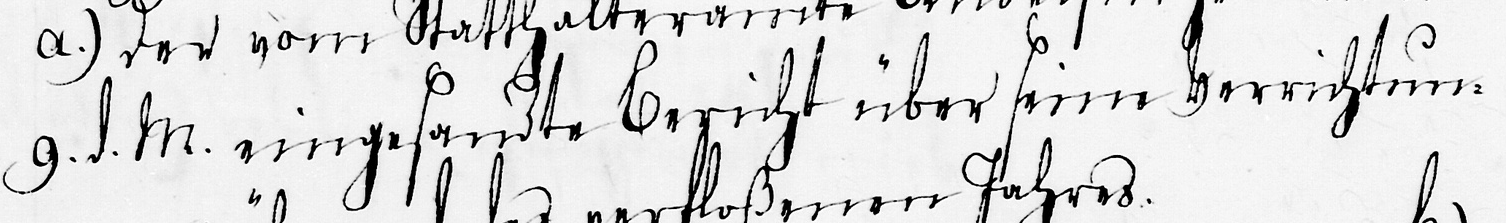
9. d. M. eingesandte Bericht über seine Verrichtun¬
